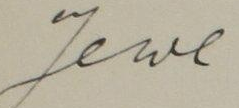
Jewe
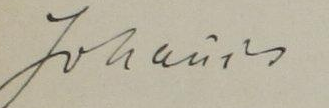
Johannis
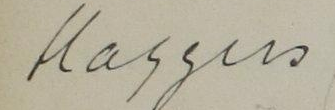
Haggers
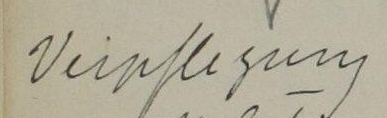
Verpflegung
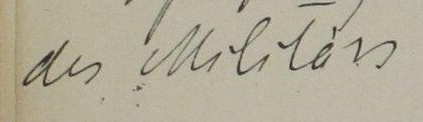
des Militärs
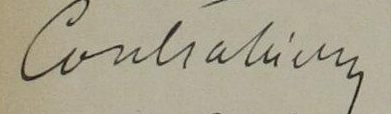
Contrahierung
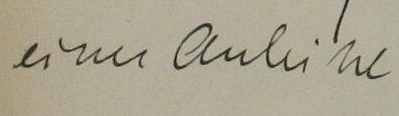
einer Anleihe
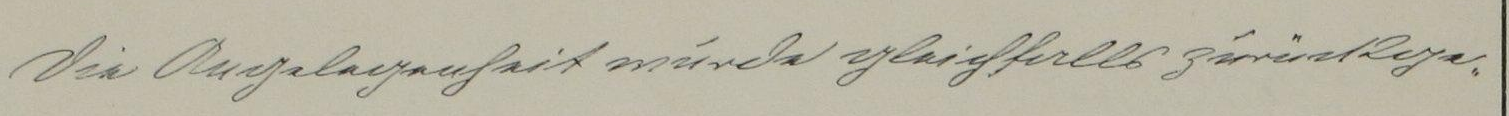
Die Angelegenheit wurde gleichfalls zurückge-
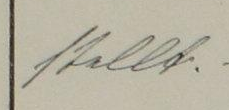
stellt.
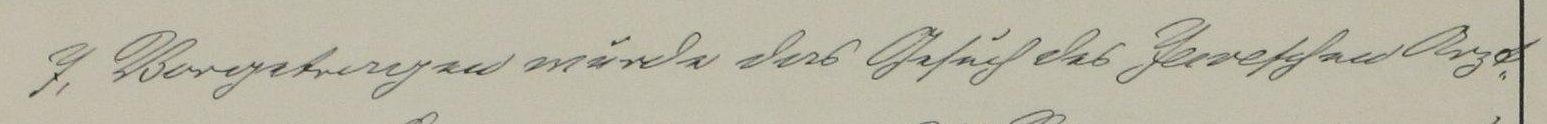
7. Vorgetragen wurde das Gesuch des Jeweschen Arzt-
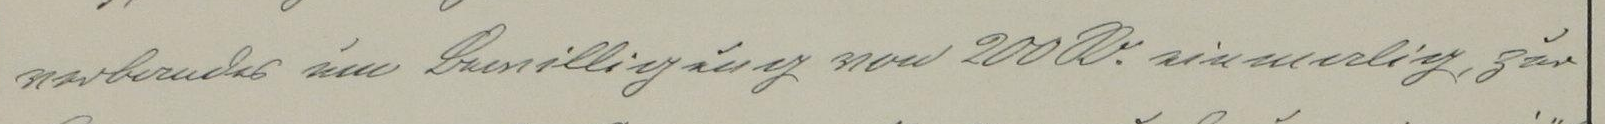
verbandes um Bewilligung von 200 Ro. einmalig, zur
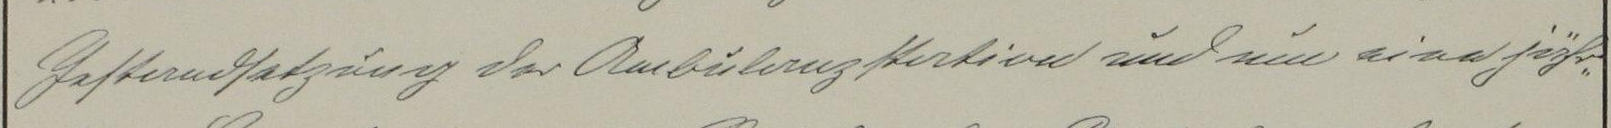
Instandsetzung der Ambulanzstation und um eine jähr-
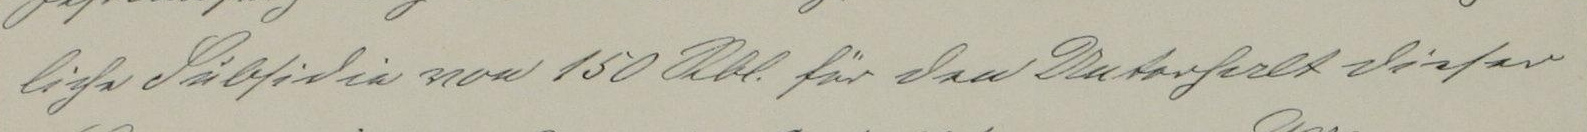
liche Subsidie von 150 Rbl. für den Unterhalt dieser
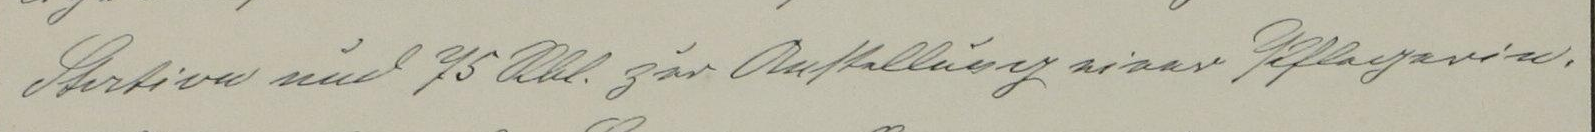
Station und 75 Rbl. zur Anstellung einer Pflegerin.
